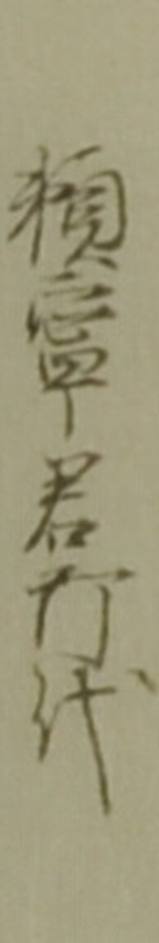頼寧君御代
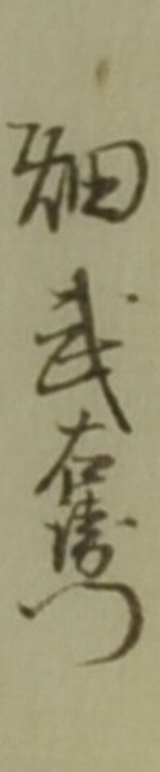畑武右衛門
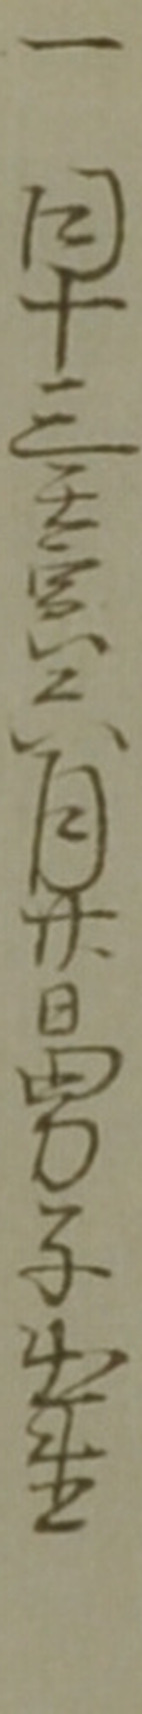一同十三壬寅六月廿日男子出生
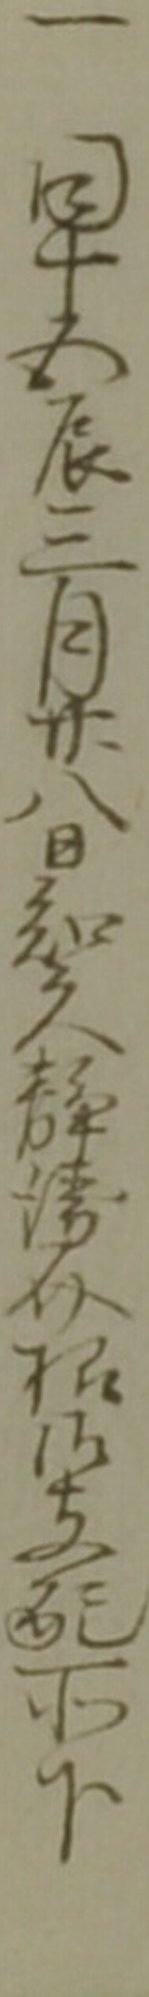一同十五辰三月廿八日知久静衛介様御支配所下
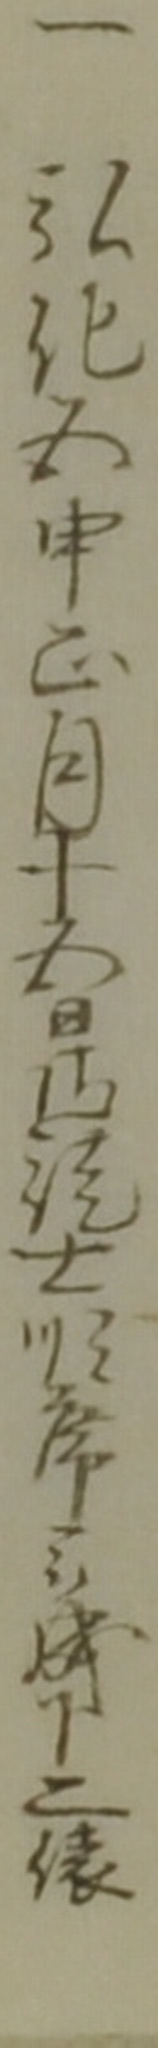一弘化五申正月十五日御徒士順席被成下二俵
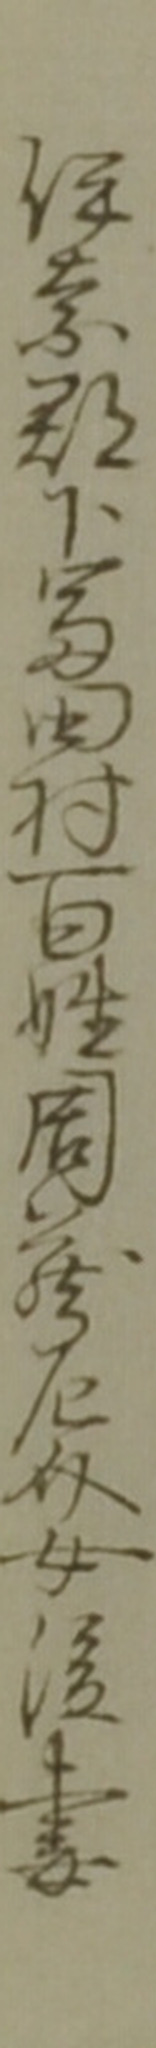伊奈郡下富田村百姓周蔵厄介女後妻
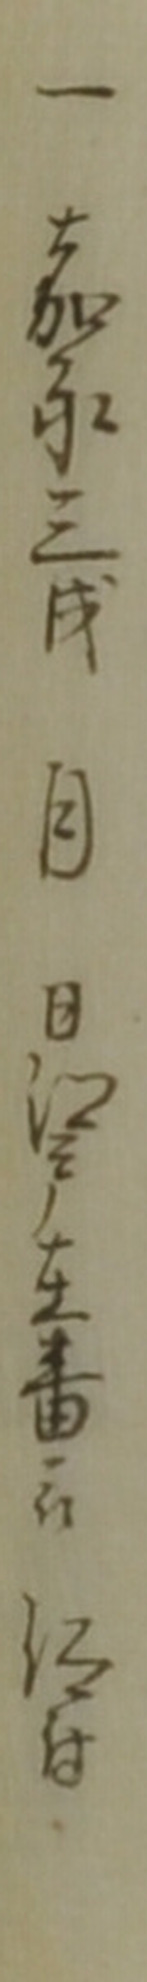一嘉永三戌月日江戸在番被仰付
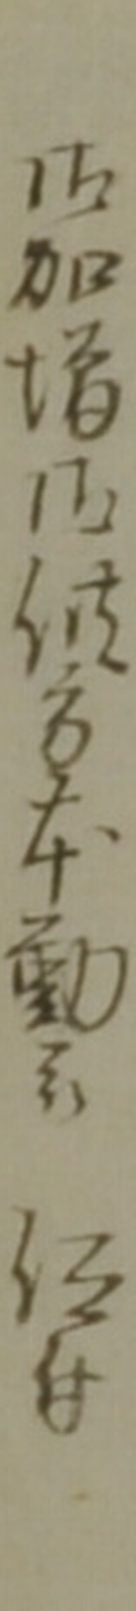御加増御供方本勤被仰付
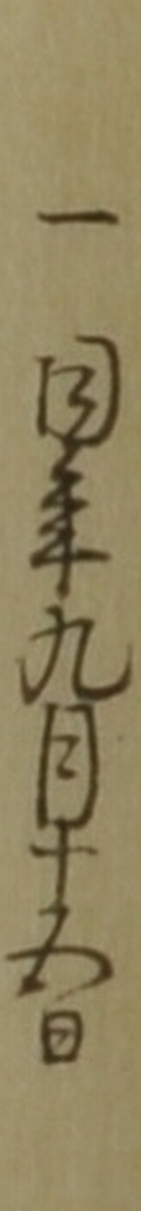一同年九月十五日
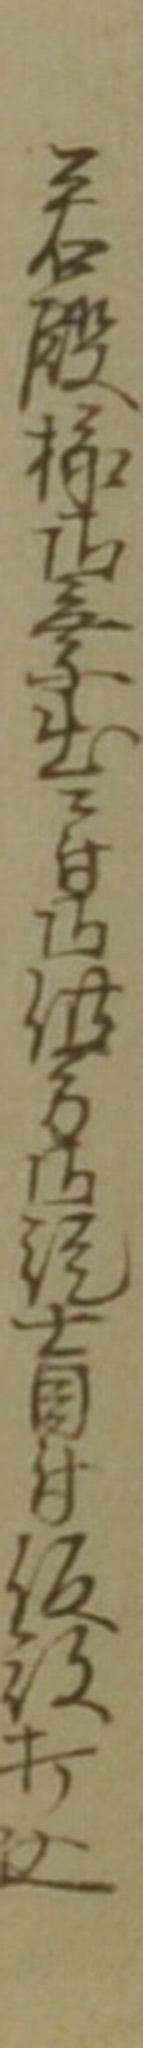若殿様御乗出ニ付御供方御徒士目付仮役打込
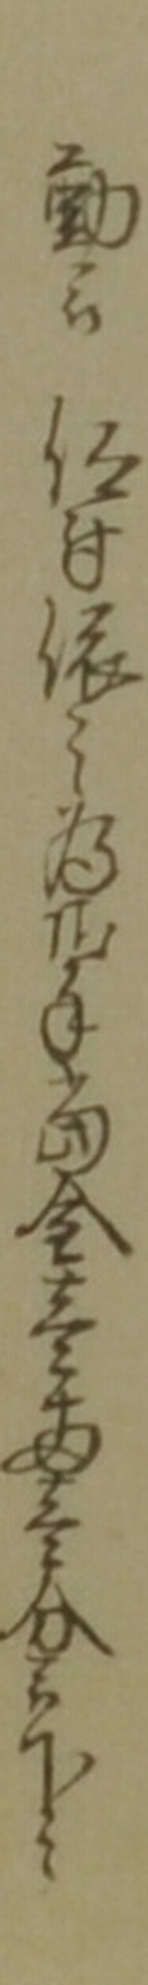勤被仰付依之為御手当金壱両壱分被下之
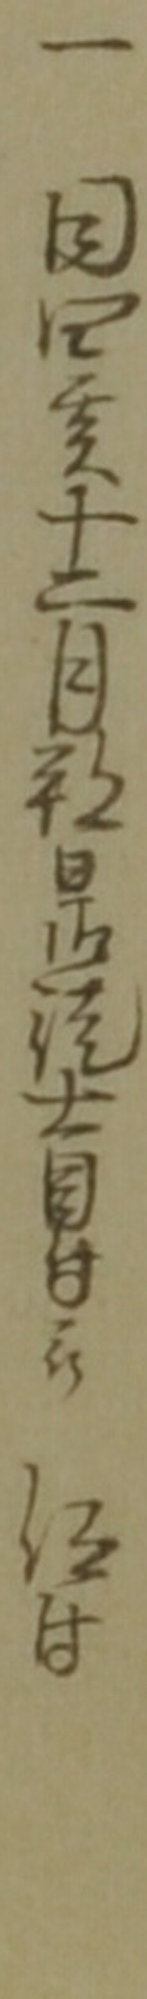一同四亥十二月朔日御徒士目付被仰付

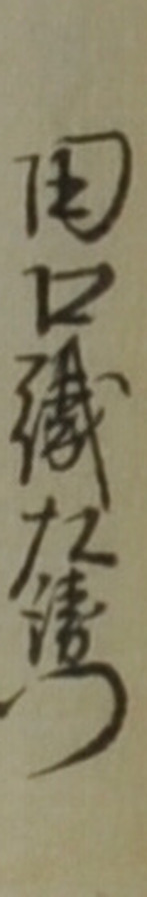田口織左衛門
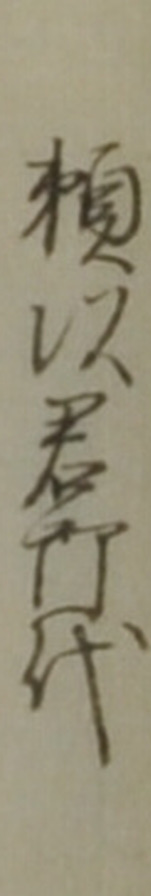頼以君御代
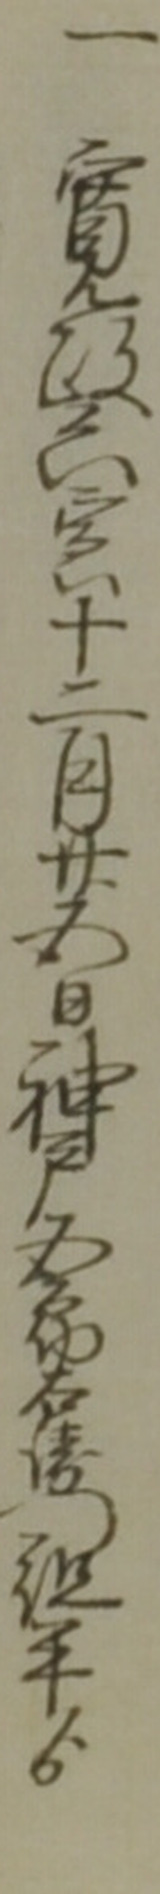一寛政六寅十二月廿五日神戸五郎右衛門組平ゟ
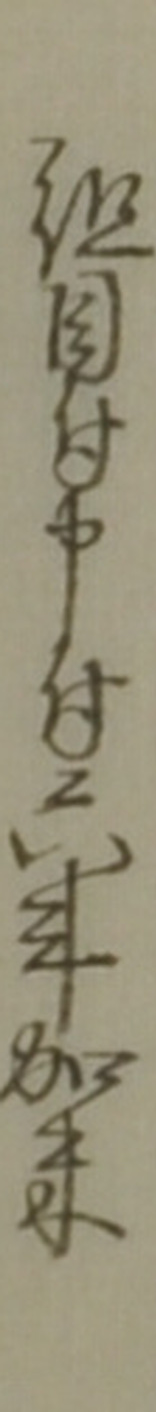組目付申付六斗加米
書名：無足諸士勤仕録（六）
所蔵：伊那市立高遠町図書館・合同会社AMANE
